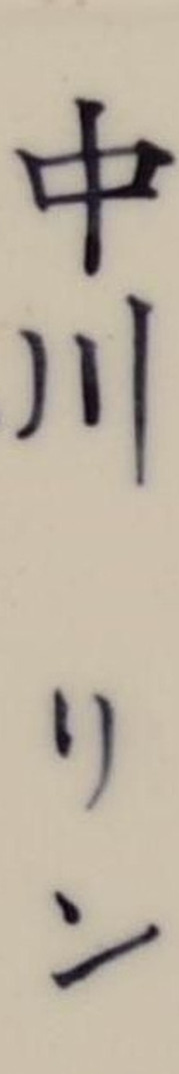中川リン
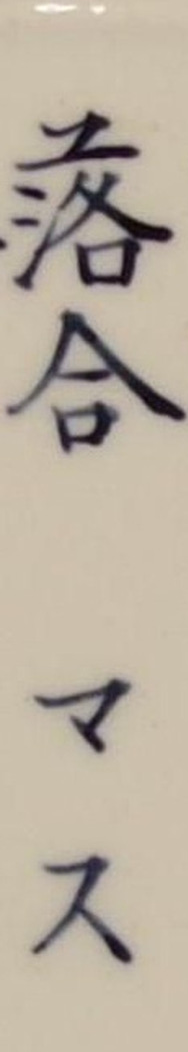落合マス
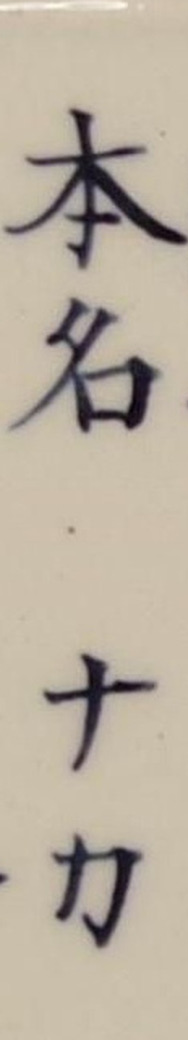本名ナカ
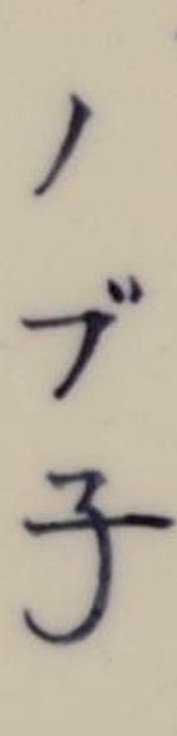ノブ子
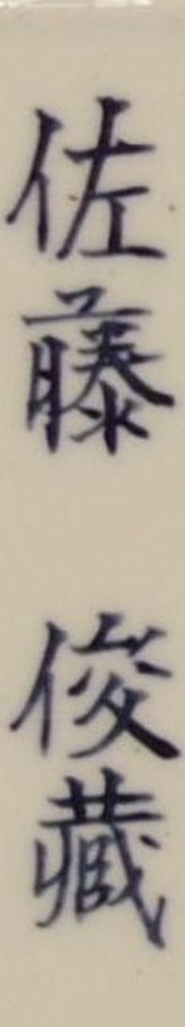佐藤俊藏
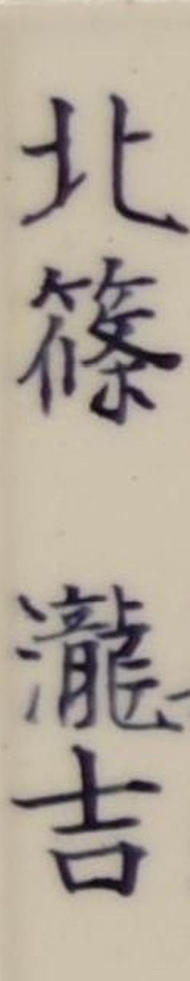北篠瀧吉

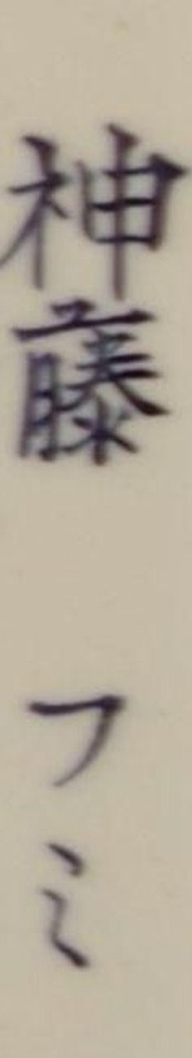神藤フミ
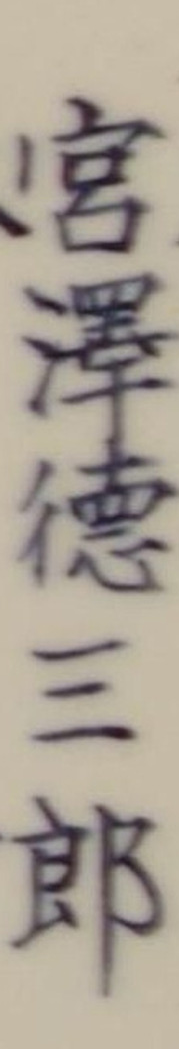宮澤徳三郎
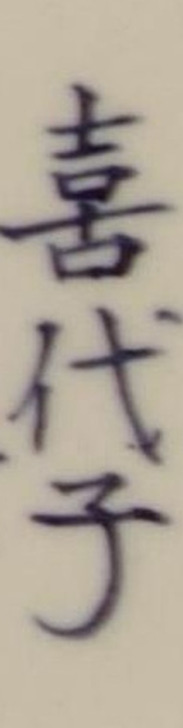喜代子
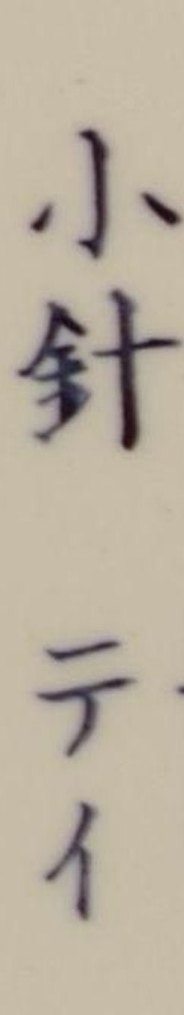小針テイ
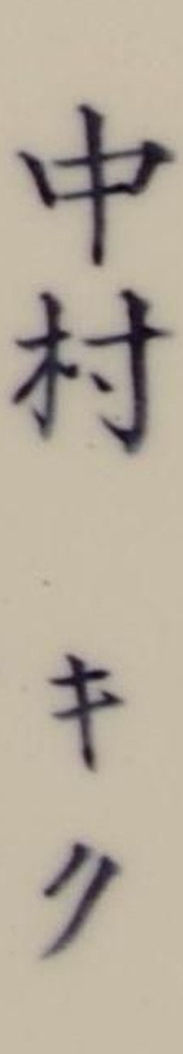中村キク
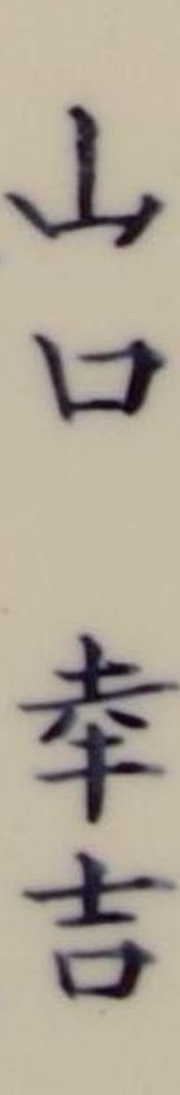山口幸吉
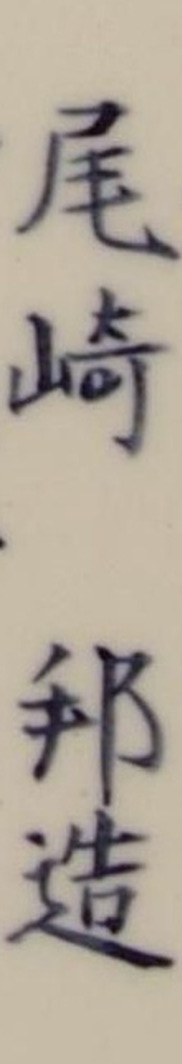尾崎邦造
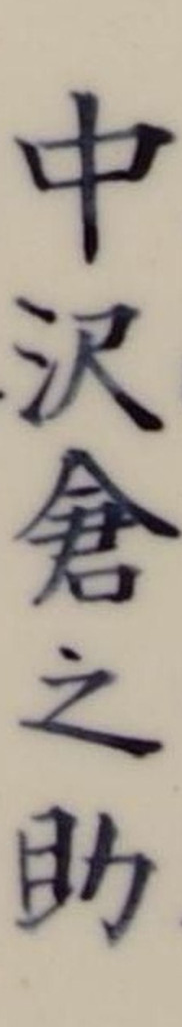中沢倉之助
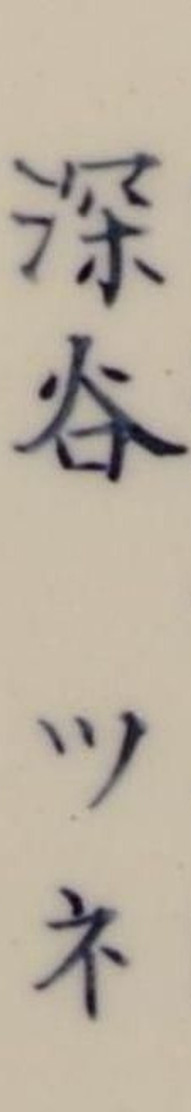深谷ツネ
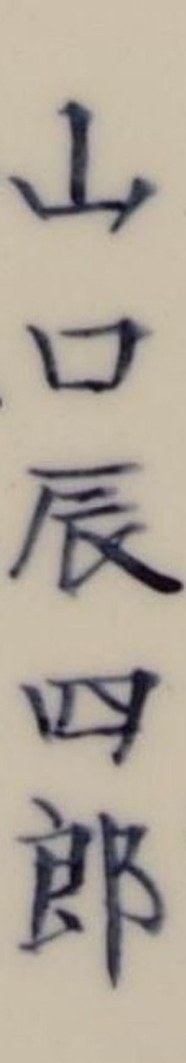山口辰四郎
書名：E~L
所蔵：高野山金剛峯寺
